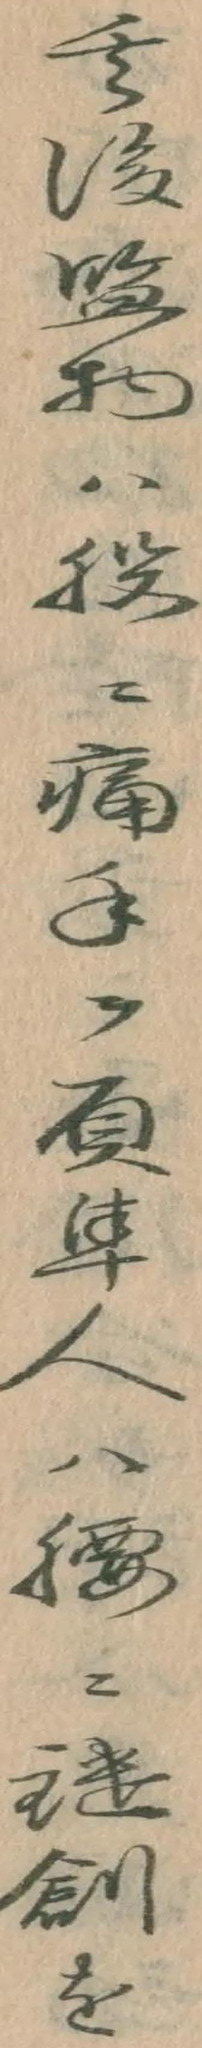其後監物は股に痛手を負隼人は腰に鑓創を
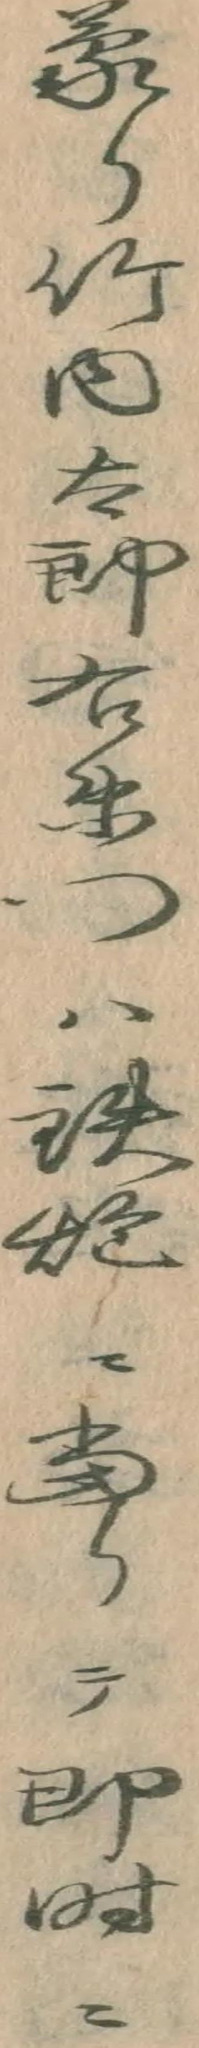承り竹内太郎右衛門は鉄炮に当りて即時に
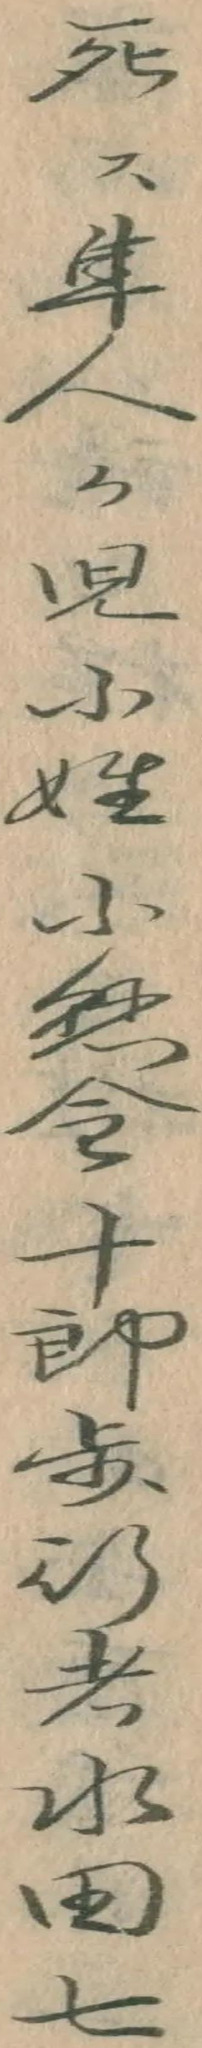死す隼人か児小姓小懸金十郎歩行者水田七
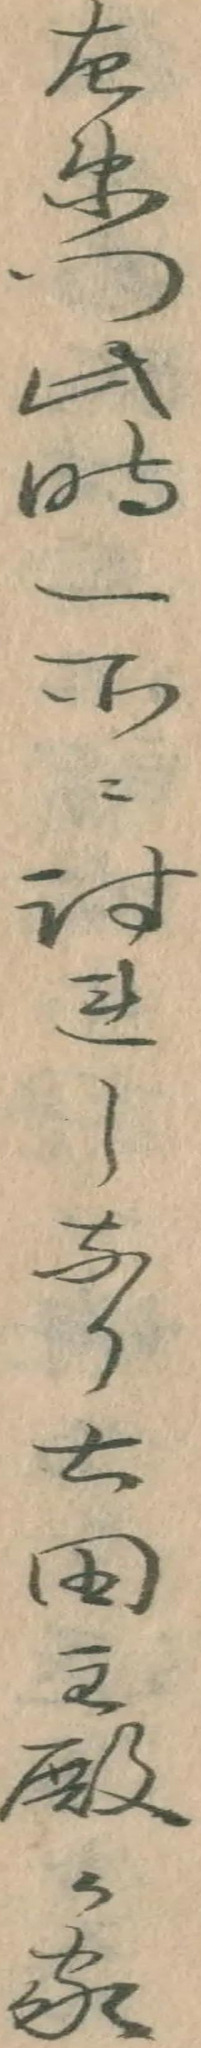左衛門此時一所に討連しなり土田主殿か家
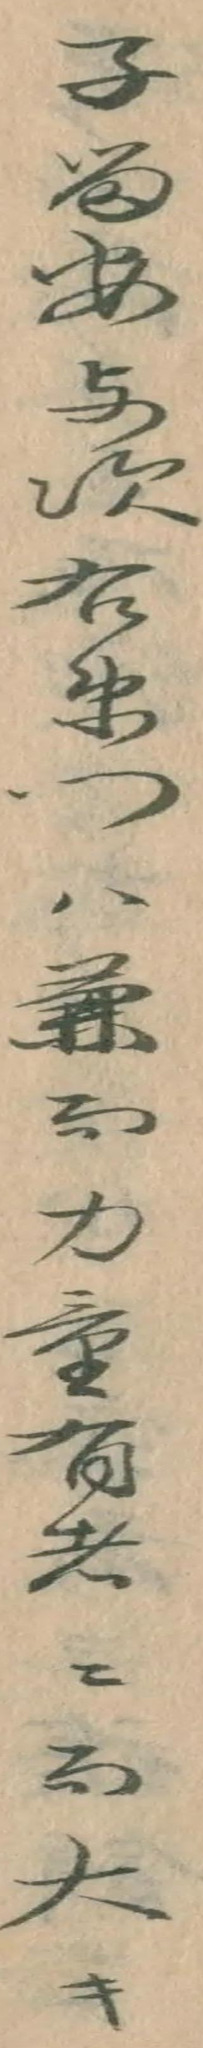子留安与次右衛門は兼而力重有者に而大き
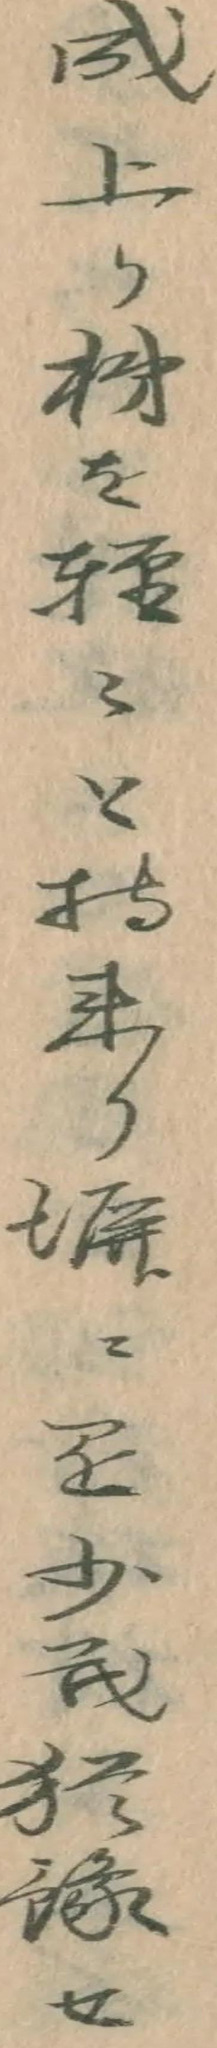成上り梯を軽々と持来り塀に懸少茂猶豫せ

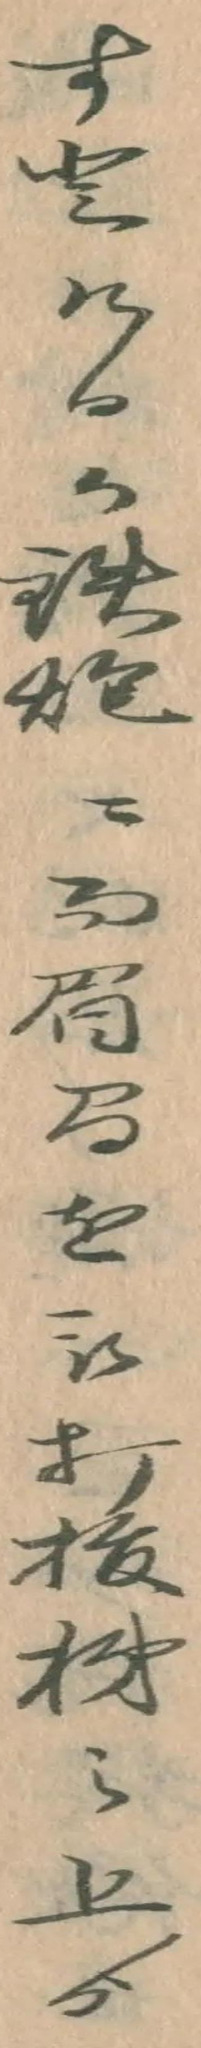す登けるか鉄炮に而眉間を被打抜梯之上ゟ
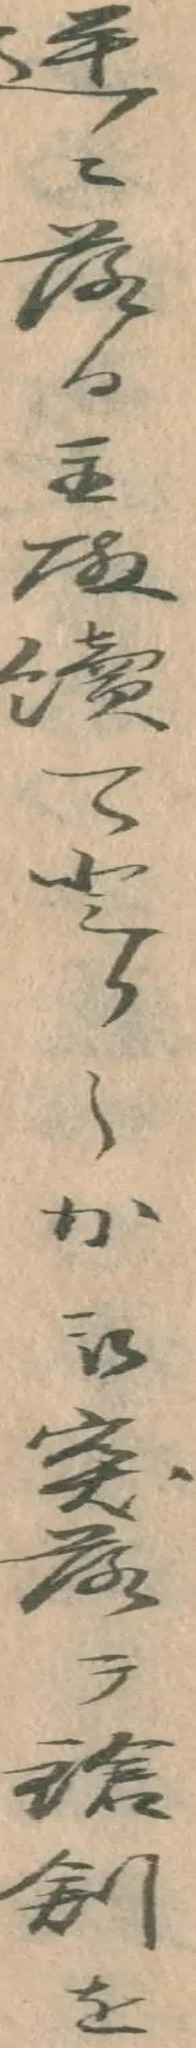逆に落る主殿続て登りしか被突落て鎗創を
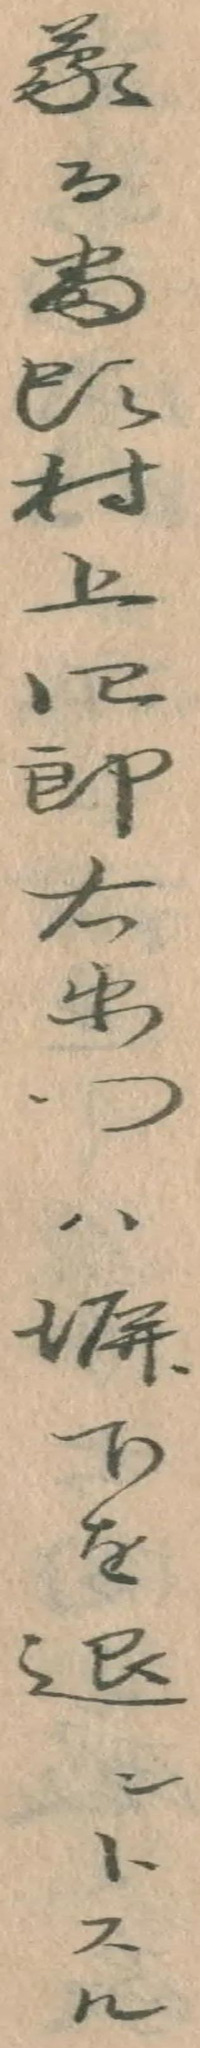承る番頭村上四郎右衛門は塀下を退しとする
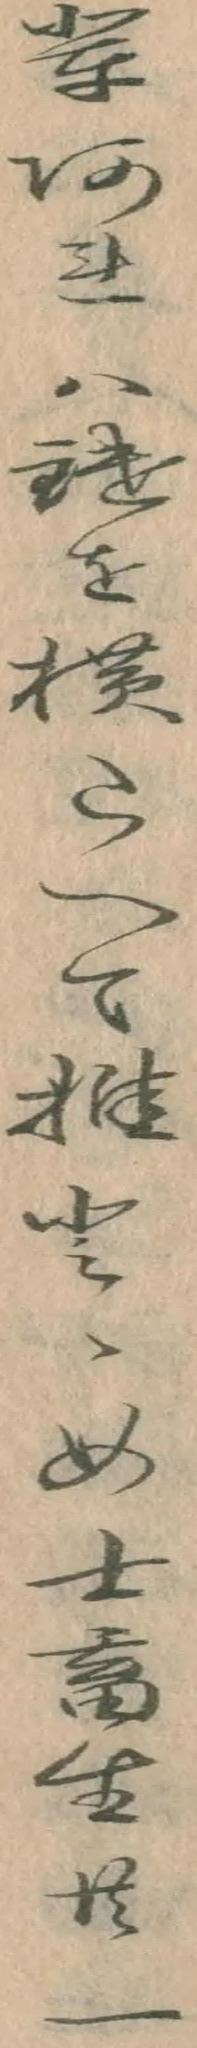輩阿連は鑓を横たへて推登々め士畜生共一
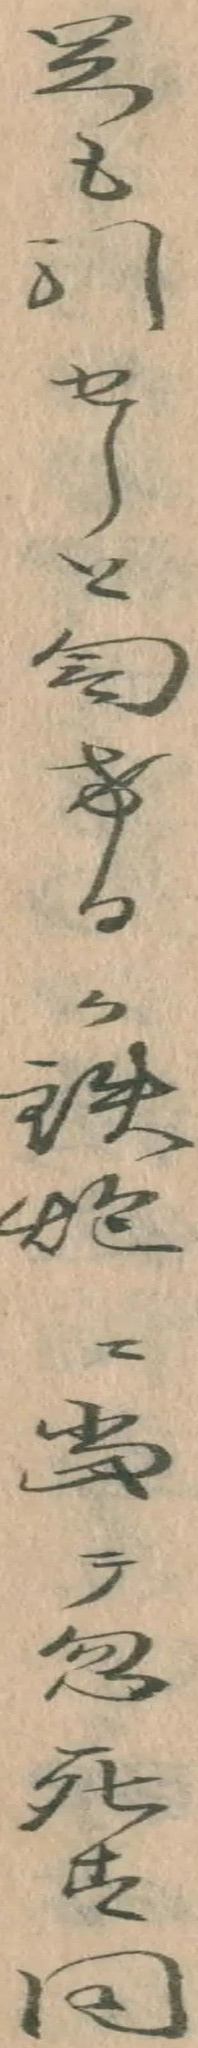足も引せしと訇希るか鉄炮に当て忽死春同
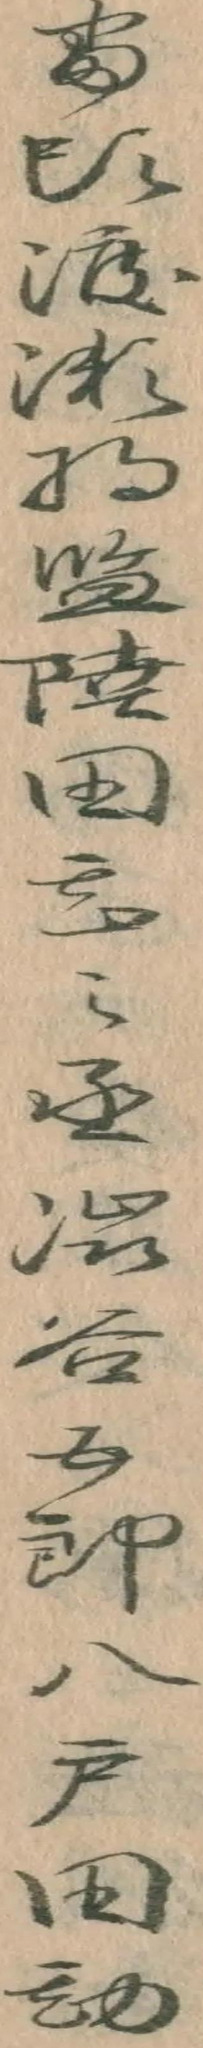番頭渡瀬将監陸田甚之丞渋谷五郎八戸田勘
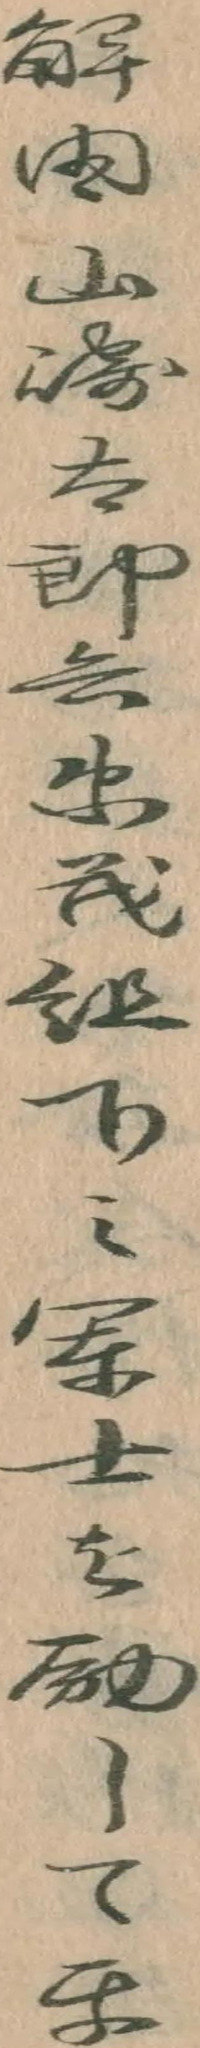解由山崎太郎兵衛茂組下之軍士を励して互
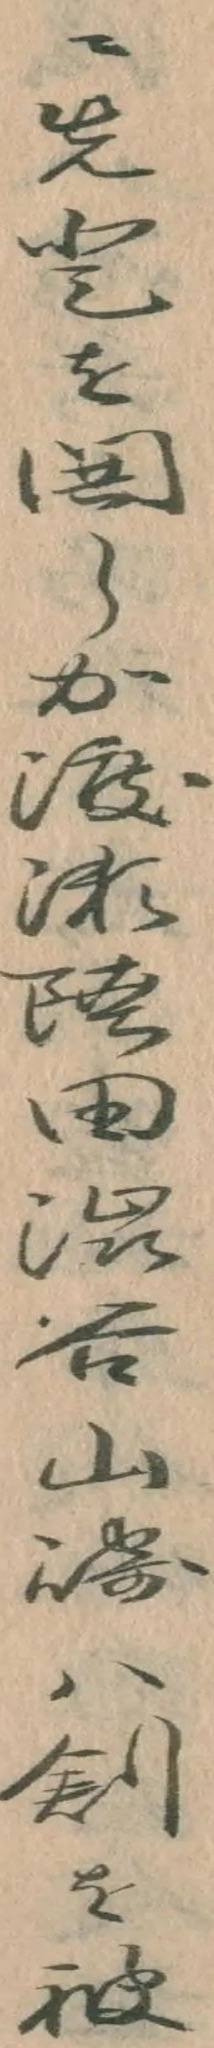に先登を鬨しか渡瀬陸田渋谷山崎は創を破
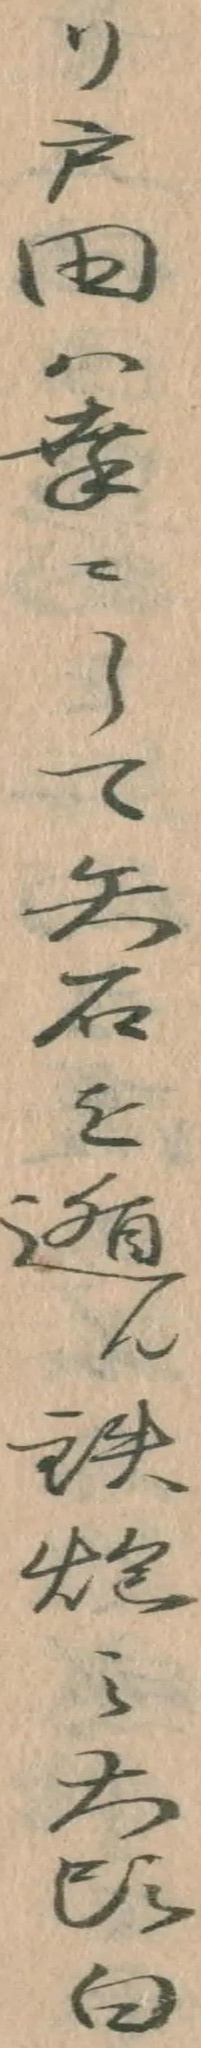り戸田は幸にして矢石を遁ん鉄炮之大頭白
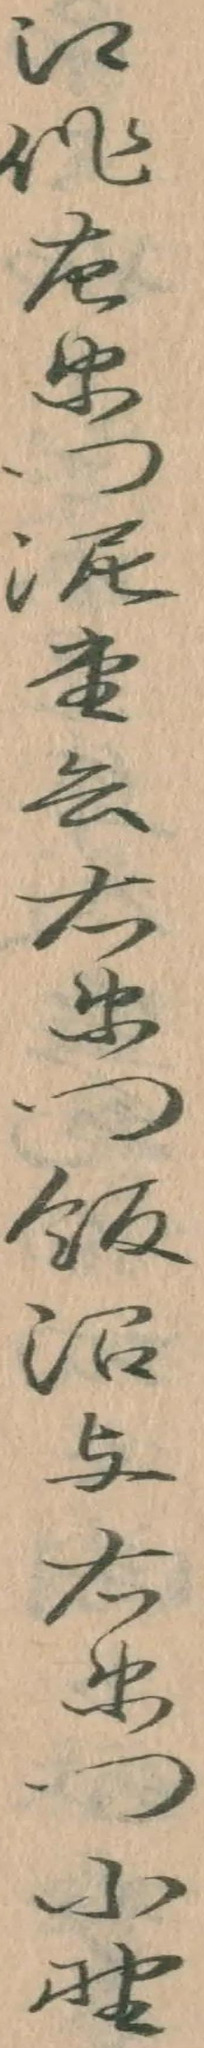江作左衛門泥金兵右衛門飯沼与右衛門小野
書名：切支丹御退治記 49巻. [5]
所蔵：国立国会図書館 National Diet Library, JAPAN
